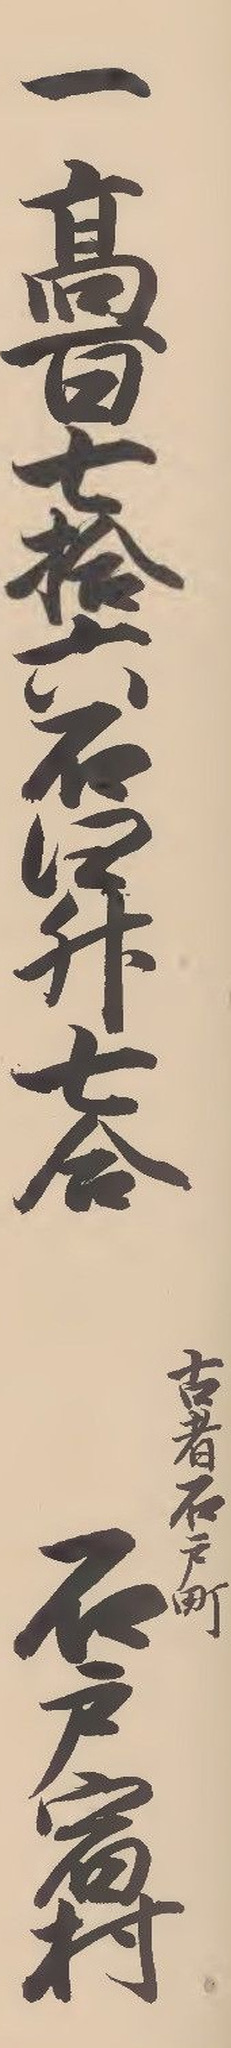一高百七拾六石四升七合石戸宿村
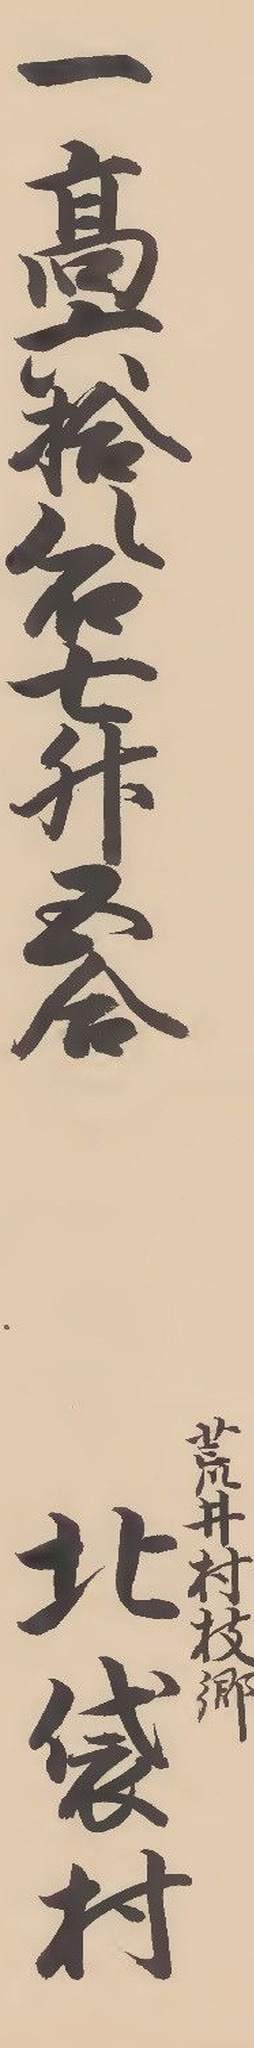一高六拾八石七升五合北袋村
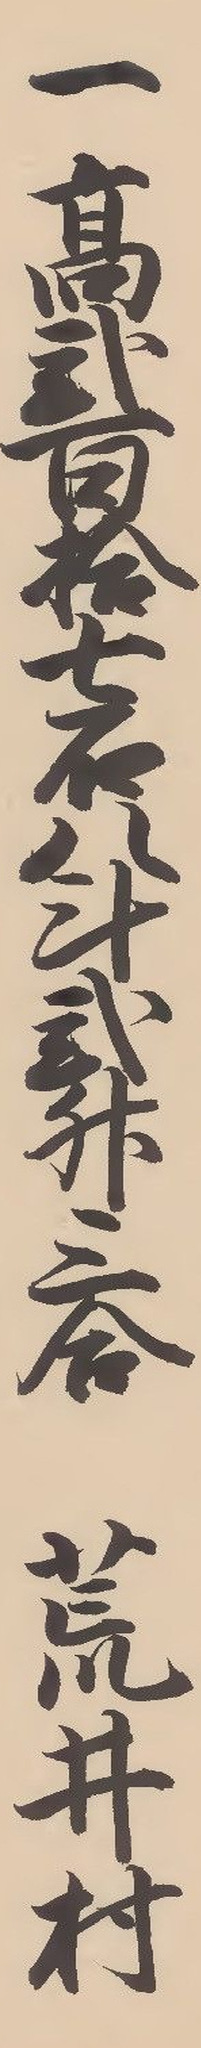一高弐百拾七石八斗弐升三合荒井村
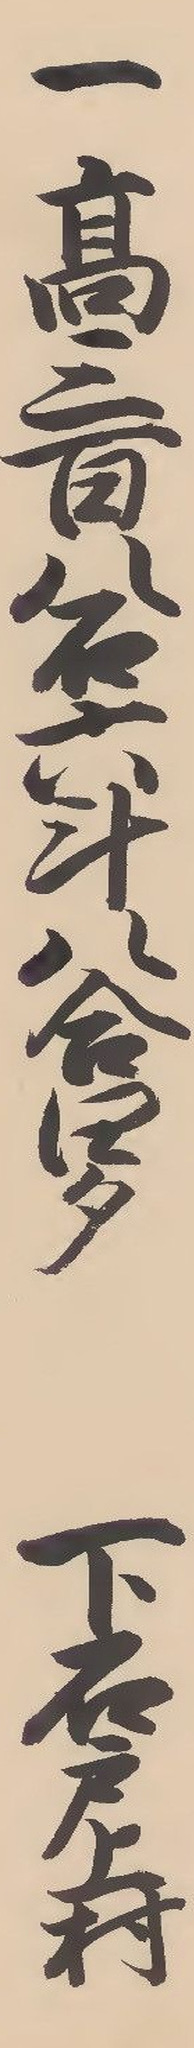一高三百八石六斗八合四勺下石戸上村

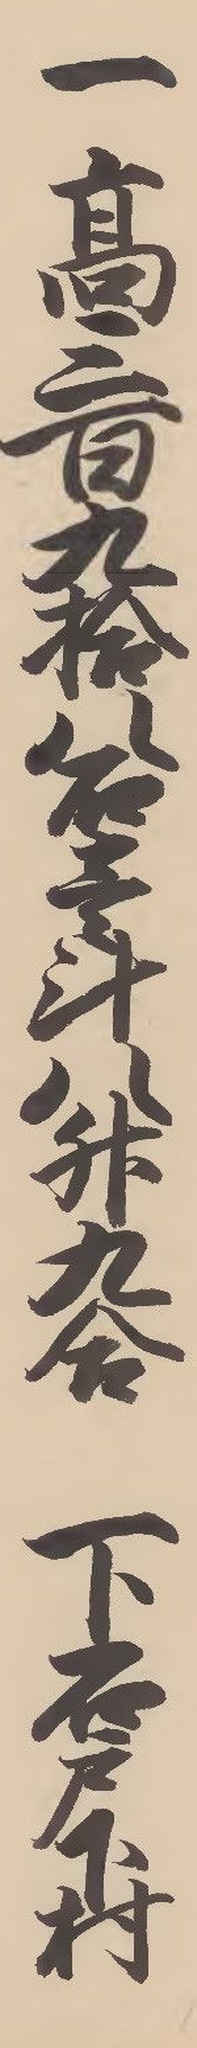一高三百九拾八石壱斗八升九合下石戸下村
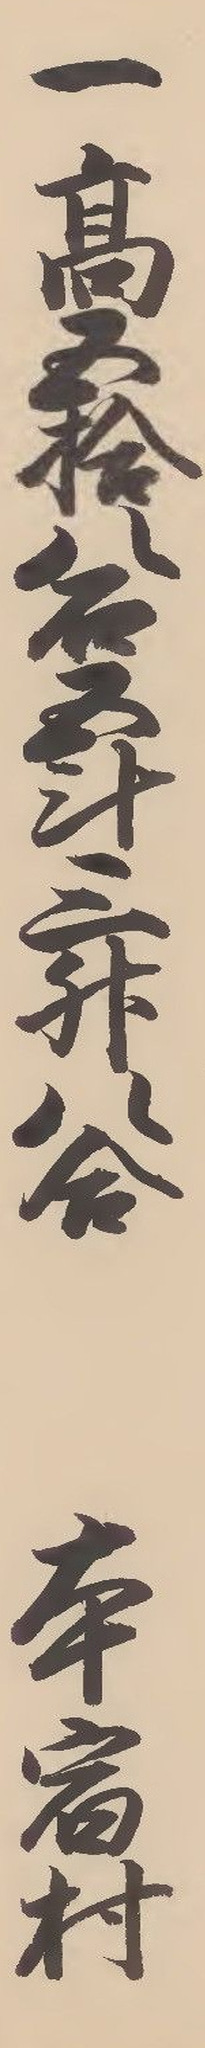一高五拾八石五斗三升八合本宿村
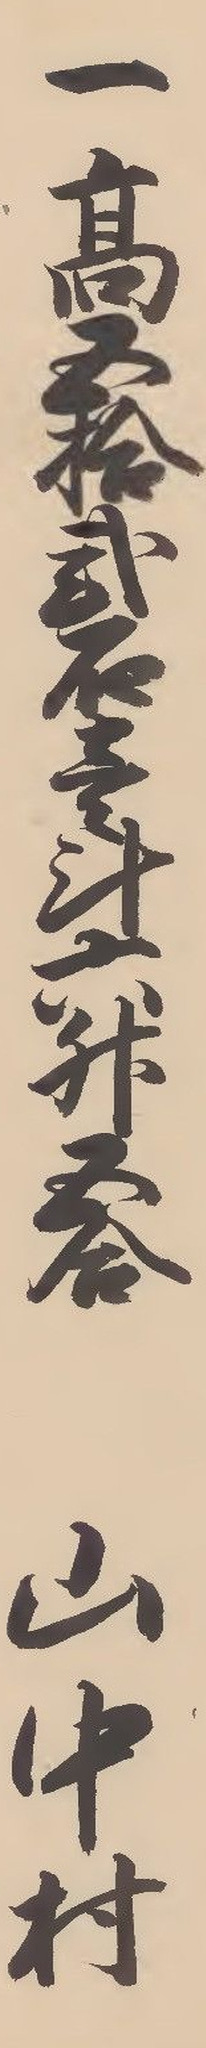一高五拾弐石壱斗六升五合山中村
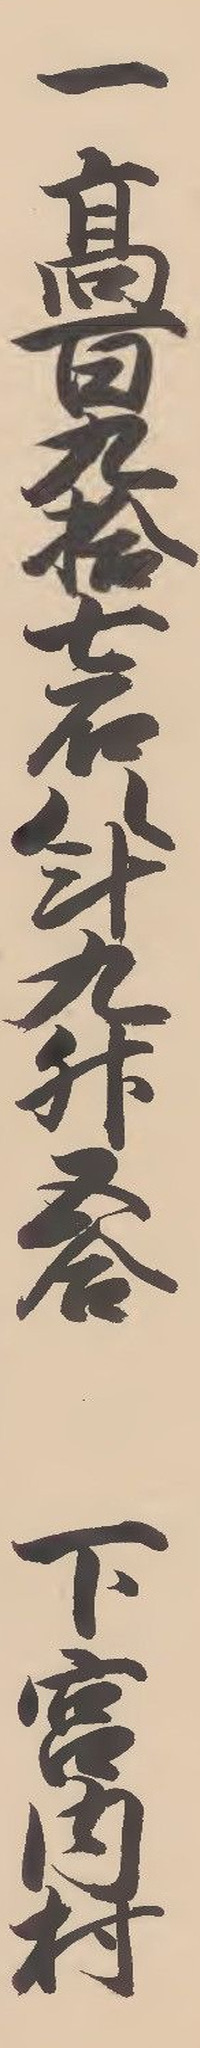一高百九拾七石八斗九升五合下宮内村
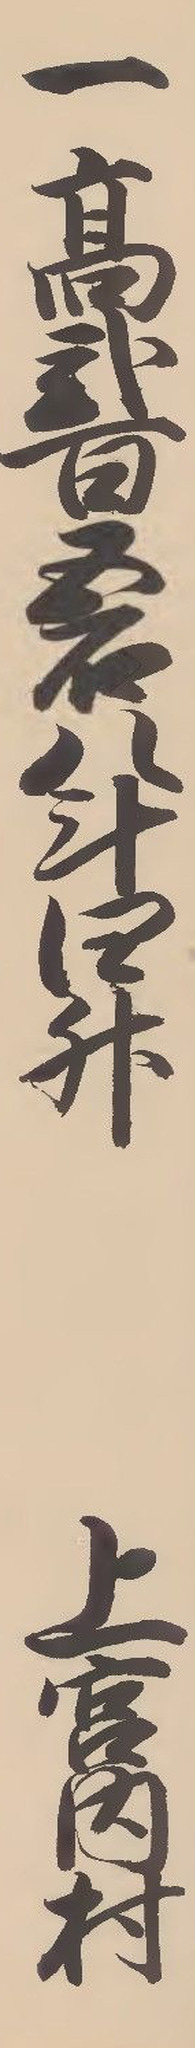一高弐百五石八斗四升上宮内村
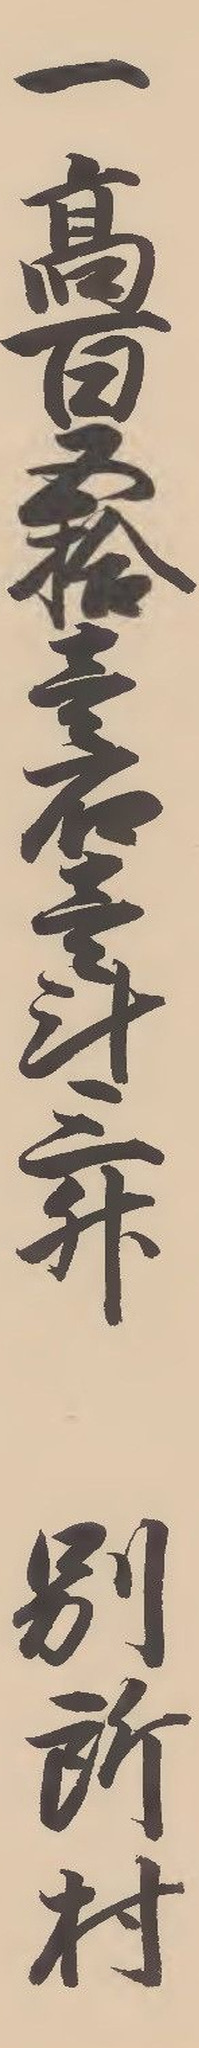一高百五拾壱石壱斗三升別所村
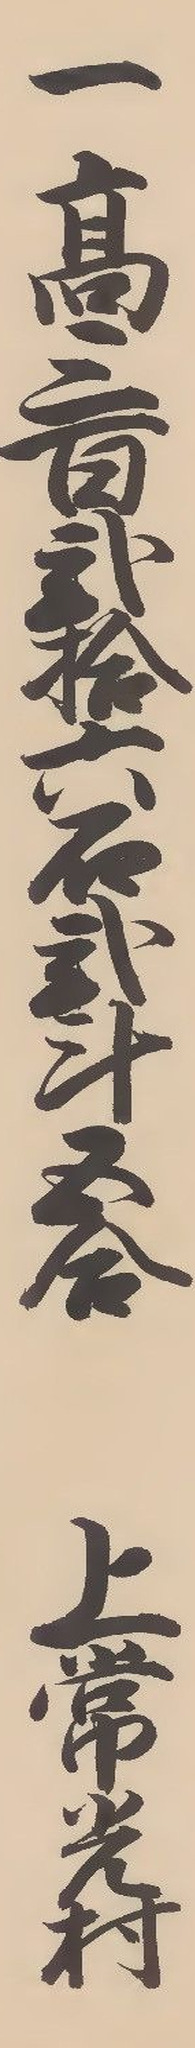一高三百弐拾六石弐斗五合上常光村
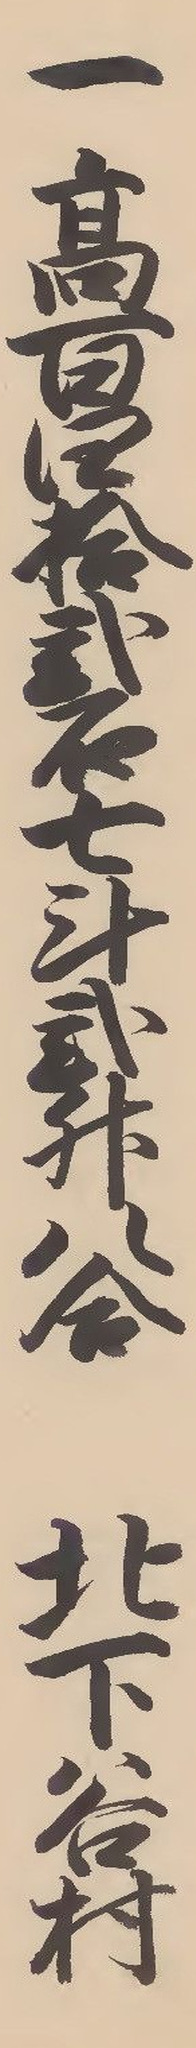一高百四拾弐石七斗弐升八合北下谷村

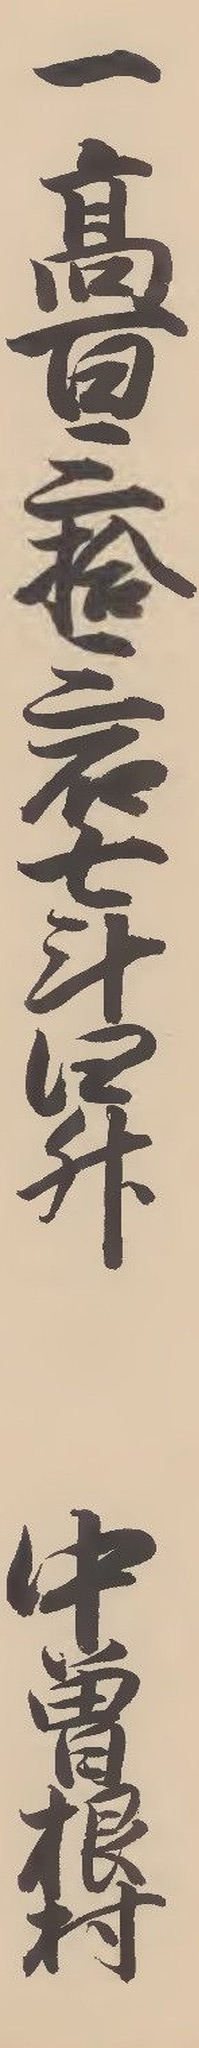一高百三拾三石七斗四升中曽根村
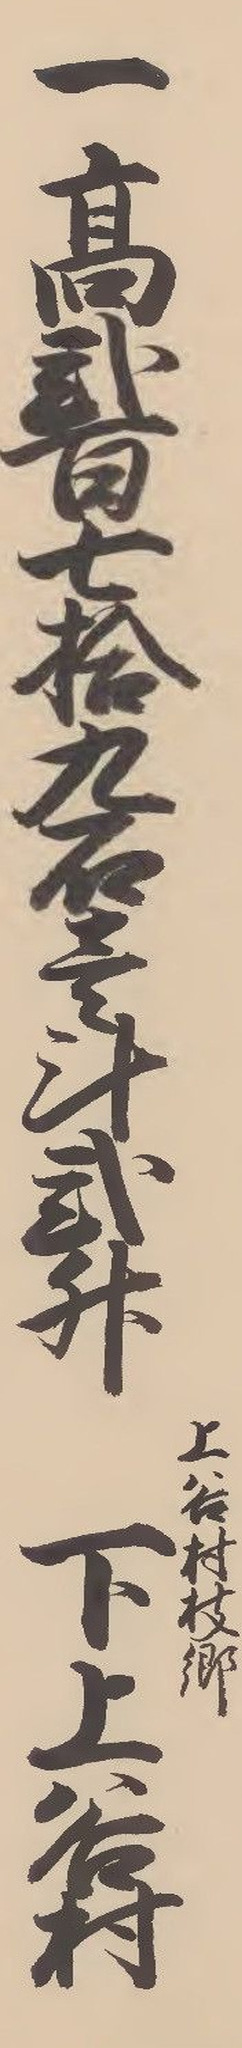一高弐百七拾九石壱斗弐升下上谷村
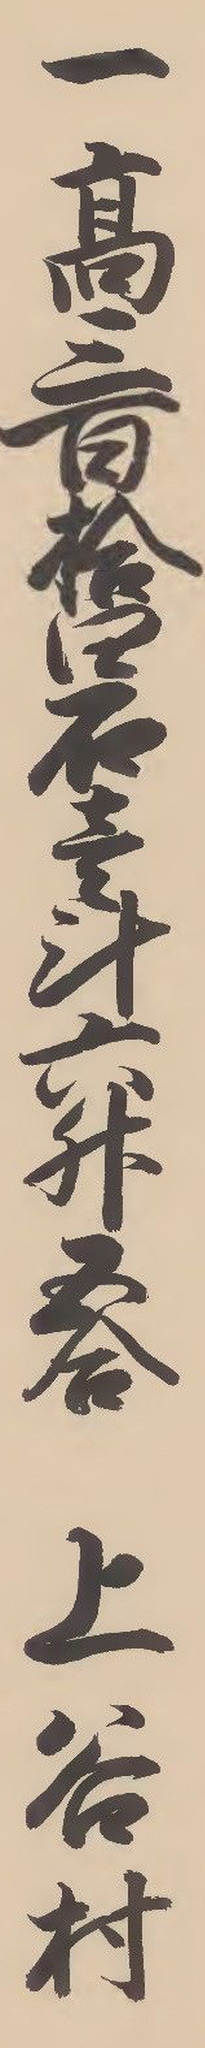一高三百拾四石壱斗六升五合上谷村
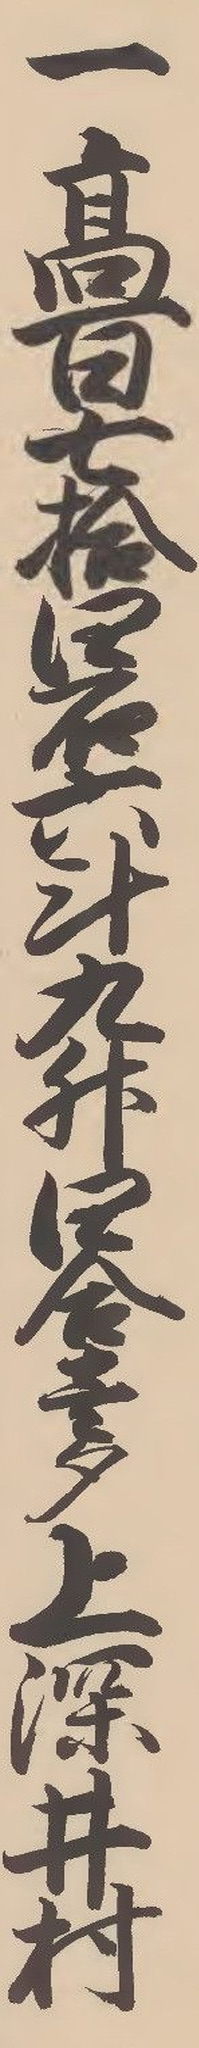一高百七拾四石六斗九升四合壱勺上深井村
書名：武蔵国郷帳　下
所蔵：国立公文書館 National Archives of Japan
